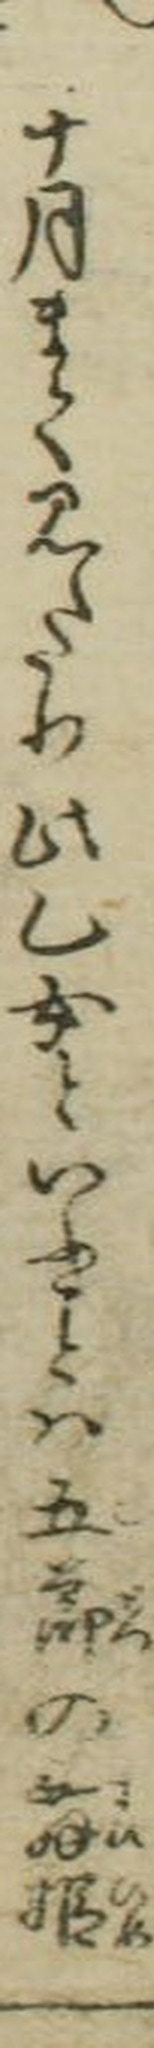十月まて見えたり此乙女といふことは五節の舞姫
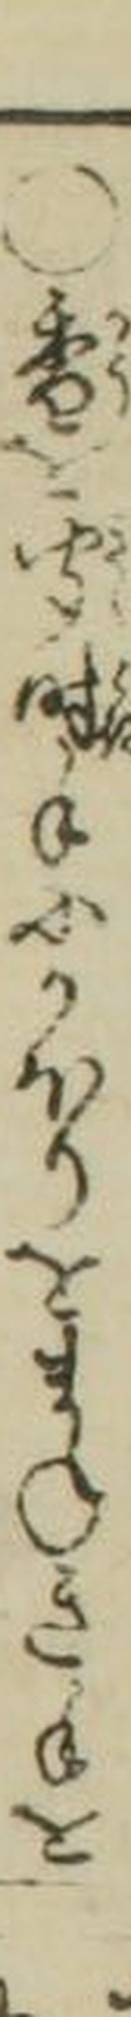○香を聞時手にかほりをまねき手を
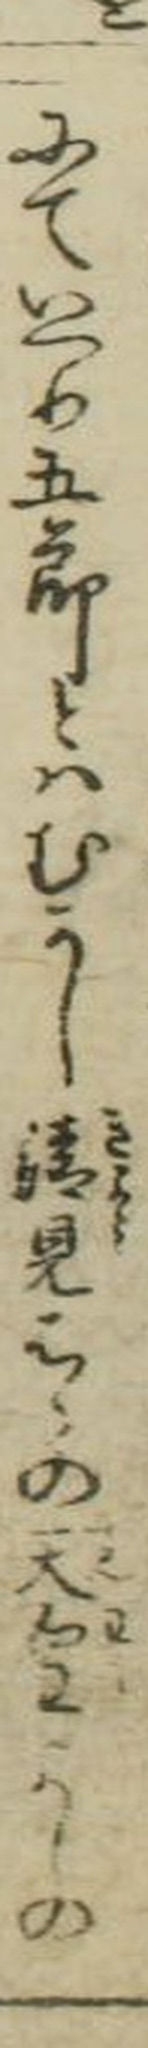にていへり五節とはむかし清見はらの天皇よしの
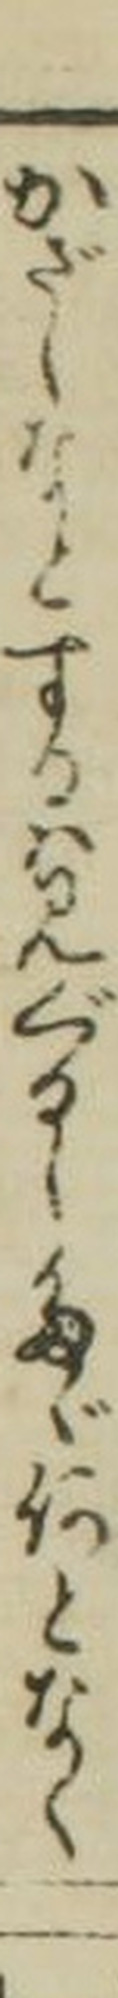かざしなとするは見ぐるしたゞ何となく
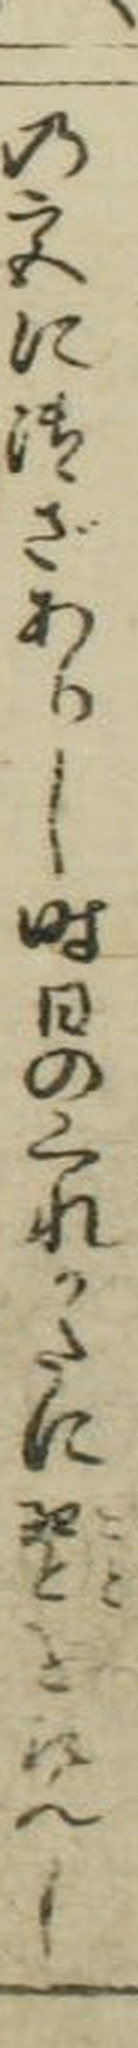の宮に御ざありし時日のくれかたに琴をたんじ
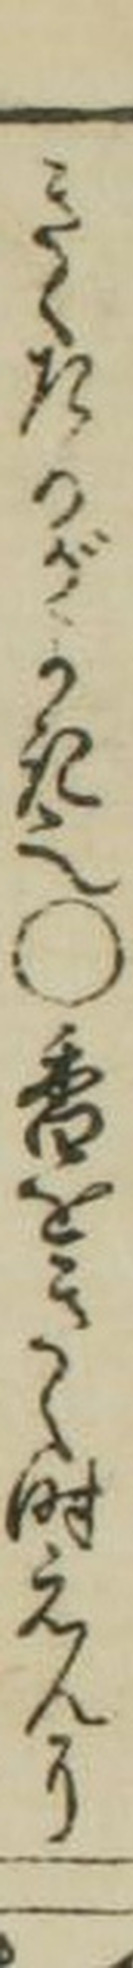きゝたるがよき也○香をきく時えんに
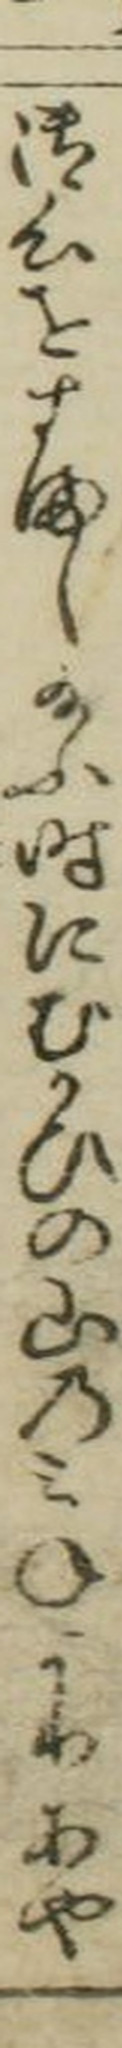御心をすまし給ふ時にむかひの山のみねよりあや
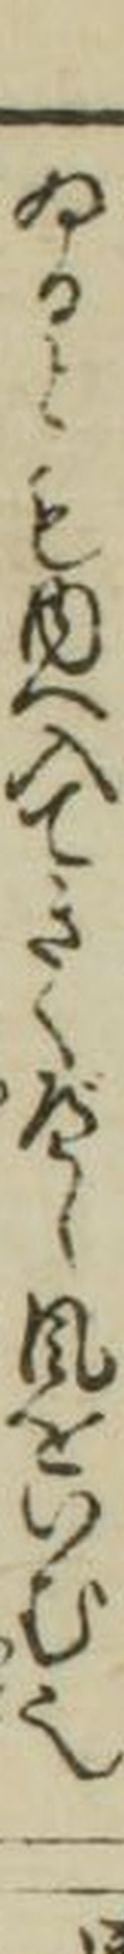ゐるとも内へ入てきくべし風をいむ也
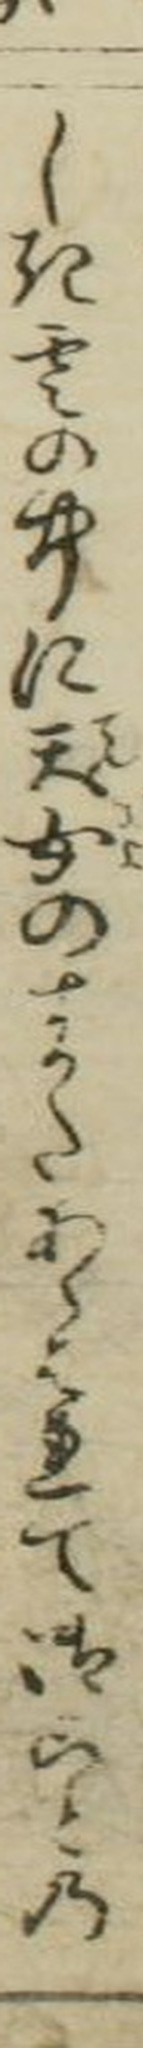しき雲の中に天女のすかたあらはれて御ことの
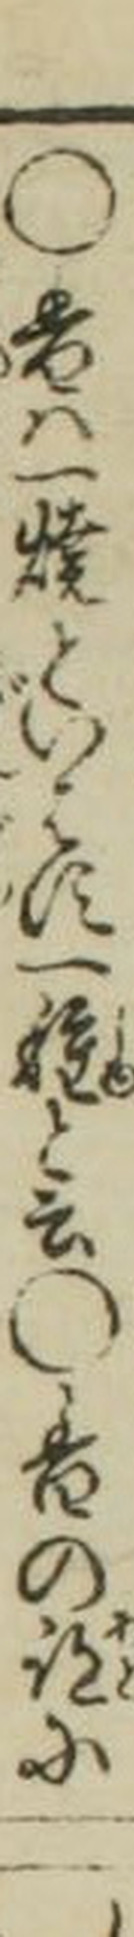○香は一焼といはす一種と云○香の跡に
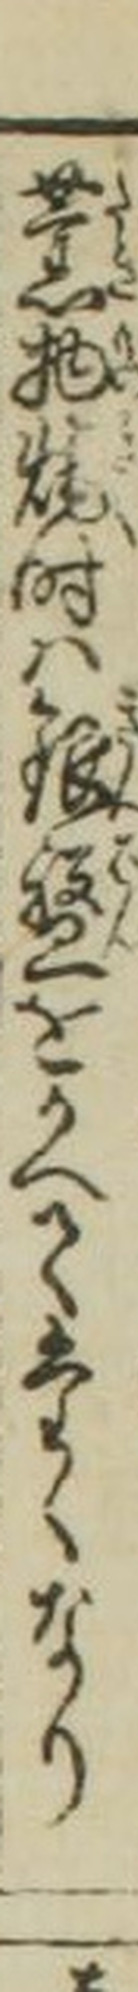薫物焼時は銀盤をかへてたくなり
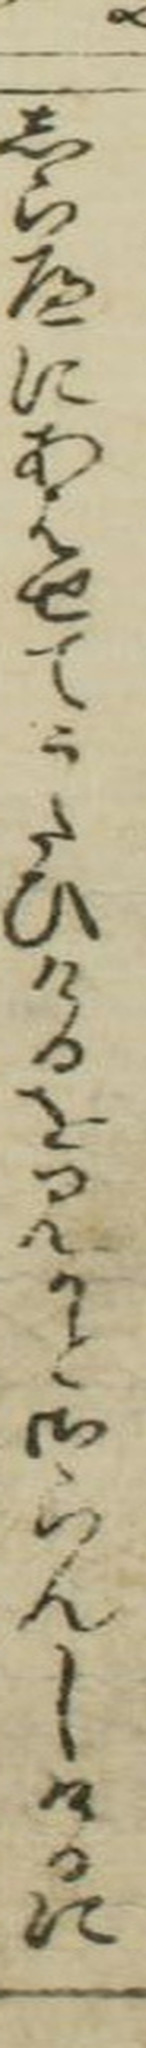しらへにあはせてうたひけるをみかと御らんしけるに
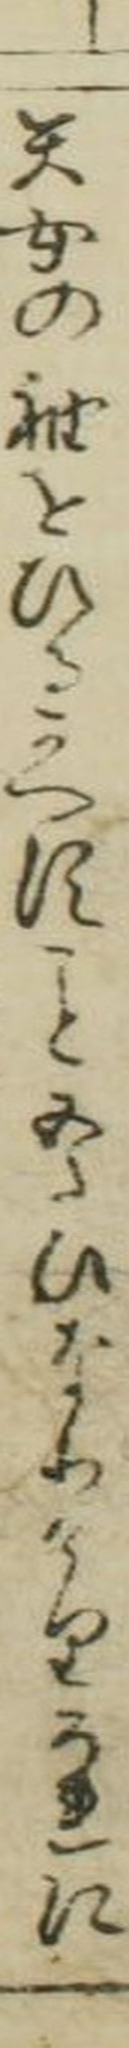天女の袖をひるかへすこと五たひなりけりそれに
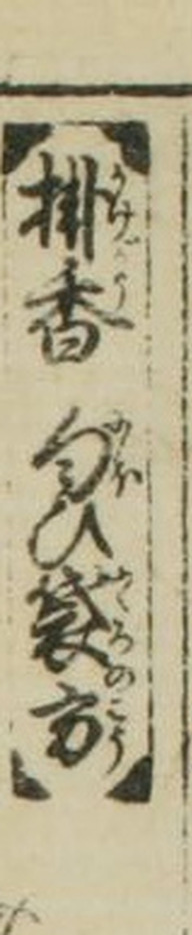掛香匂ひ袋方
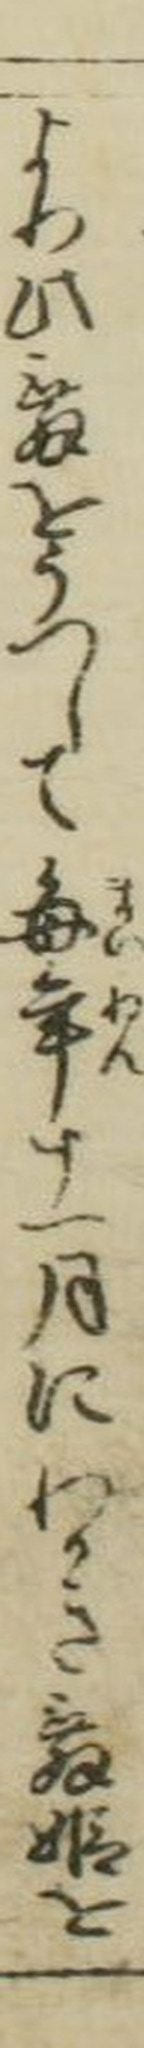より此舞をうつして毎年十一月にわかき舞姫を
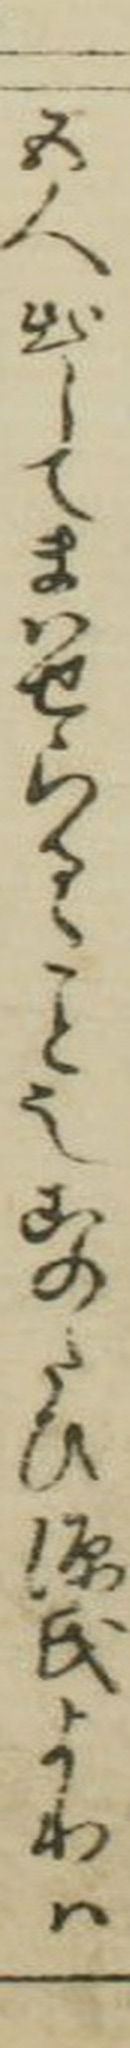五人出してまはせらるゝこと也このたひ源氏よりは
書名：女源氏教訓鑑
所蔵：東京学芸大学附属図書館
